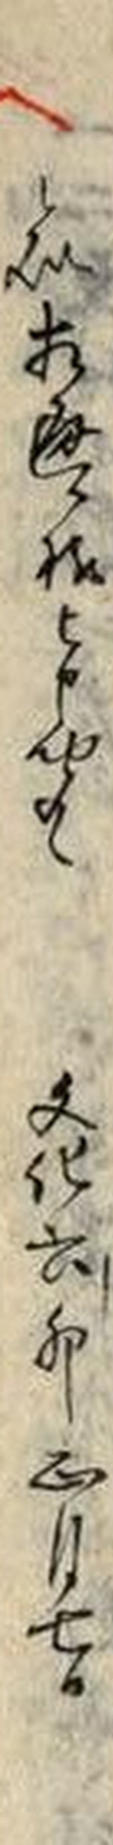候処相通候様被申聞候文化六卯正月七日

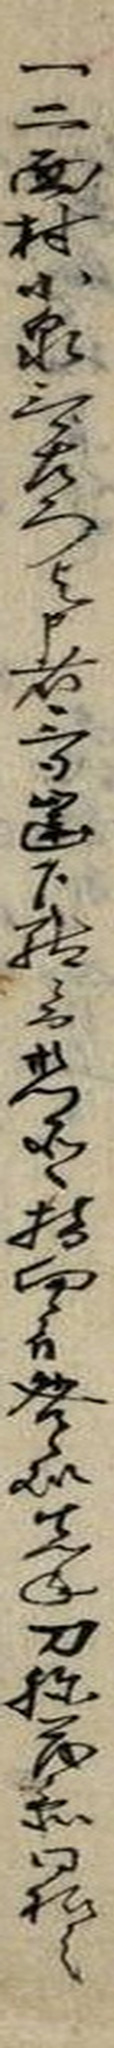一二面村小泉三郎左衛門と申者三ツ歯下駄に而御門所へ指向候に付咎候処先年刀祢茂兵衛同様之
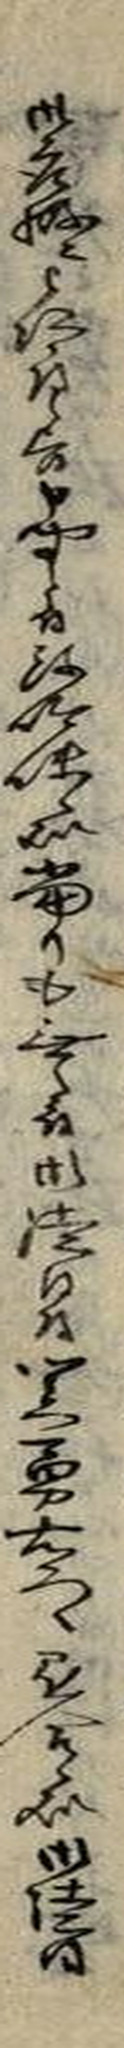御取扱に被仰付候旨申聞候に付致吟味候処当りも無之候に付御徒目付関勇右衛門へ懸合候処御徒目
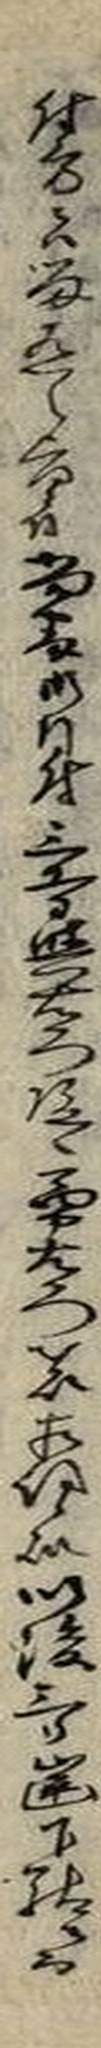付方には留有之候旨に付当番御目付三寺与右衛門殿へ勇左衛門を以相伺候処以後三ツ歯下駄に而
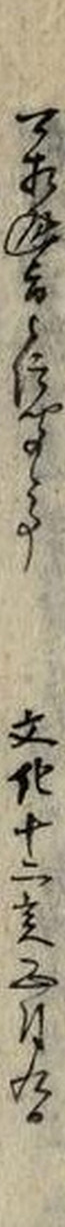可相通旨被仰聞候事文化十二亥正月九日
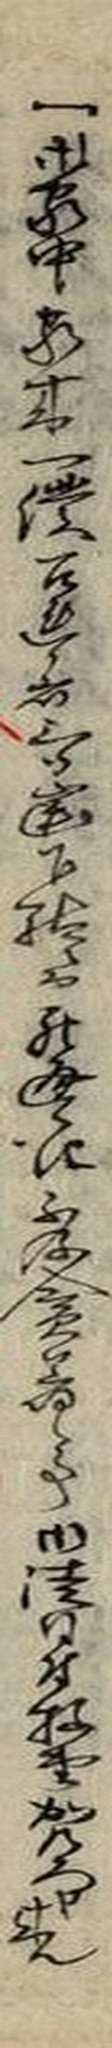一御家中家来一僕召連候者三ツ歯下駄に而罷通候儀不致貪着候事御徒目付牧野加左衛門申来候
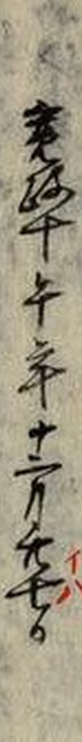寛政十午年十二月廿七日
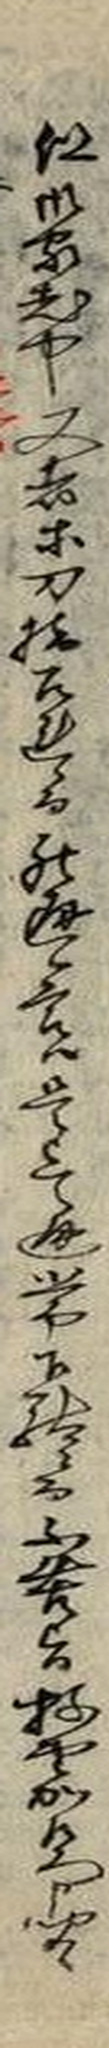但御家老中又者等刀指召連候而罷通候節は是迄之通常下駄に而不苦旨牧野加左衛門申聞候
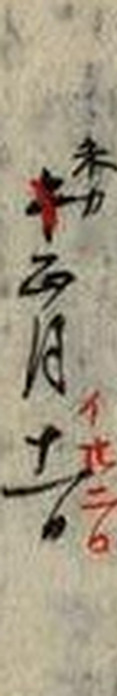未正月十一日
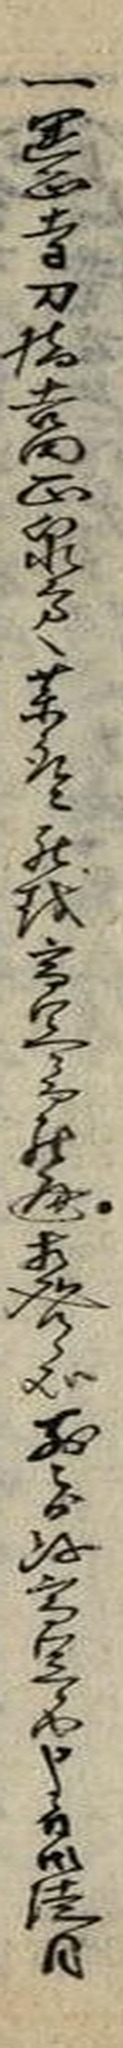一運正寺刀指吉田正泉方へ薬取に罷越高足に而罷通相咎候処前々ゟ致高足候由申に付御徒目
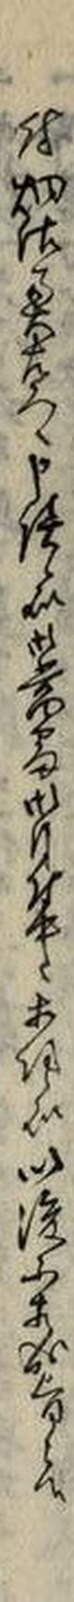付畑佐奥左衛門へ申談候処御当番御目付中へ相伺候処以後不相成旨に候
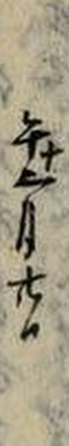午十二月廿日
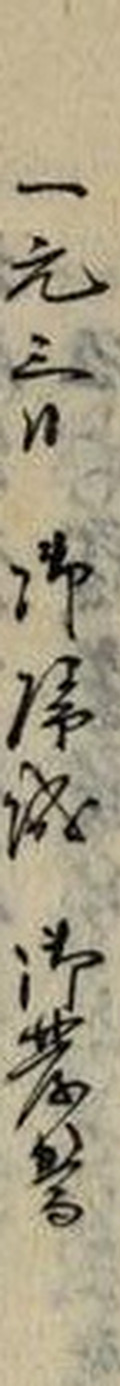一元三日御帰城御発駕
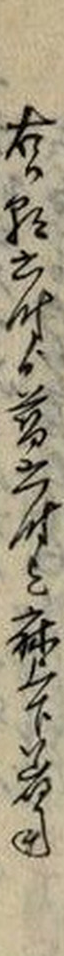右は朝六時ゟ暮六時迄麻上下着用
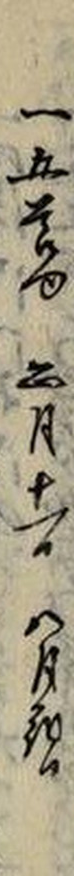一五節句正月十一日八月朔日
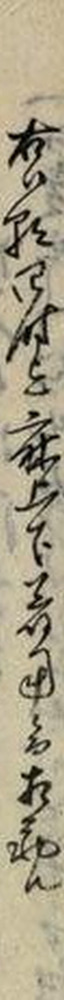右は朝四時迄麻上下着用に而相勤ル
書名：御門御櫓之部
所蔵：福井県文書館 Fukui Prefectural Archives
